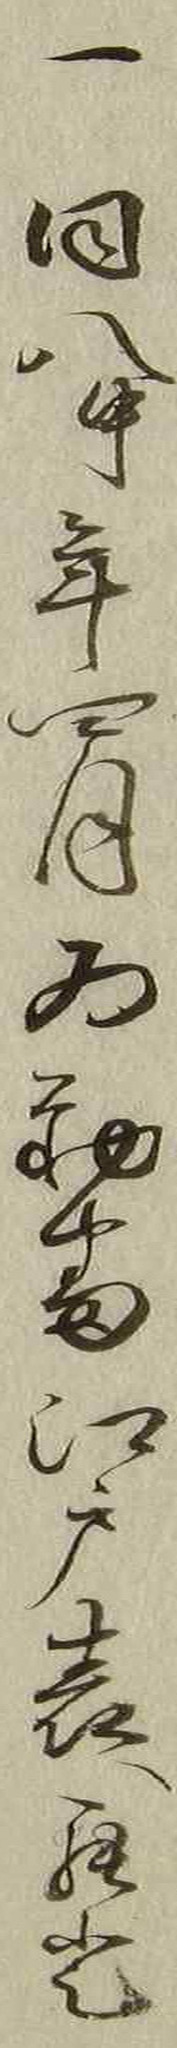一同八申年四月為勤番江戸表へ罷登
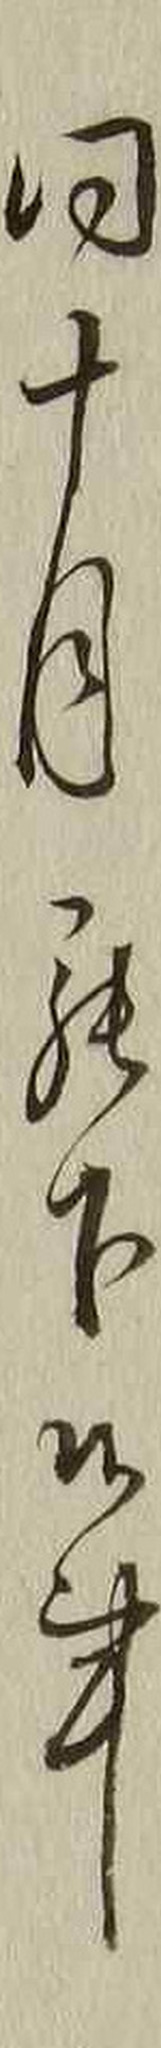同十月罷下候事
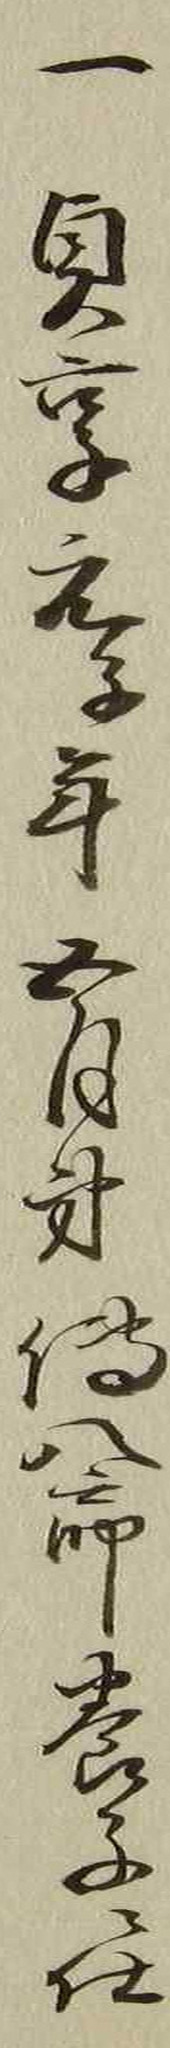一貞享元子年五月弟伝八郎養子ニ仕
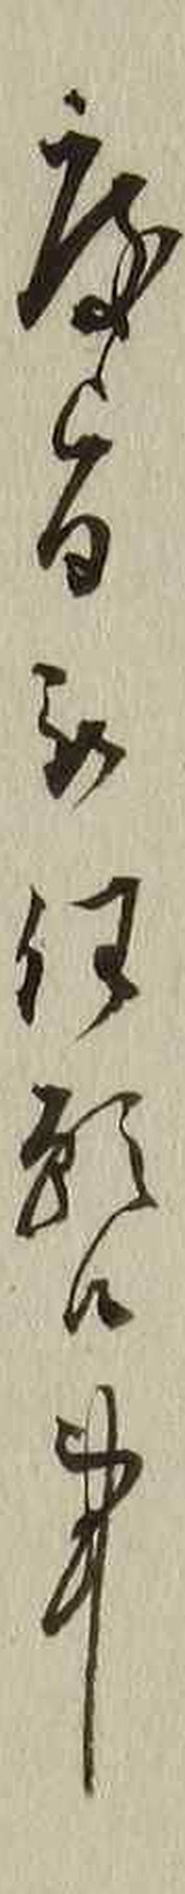度旨被任願候事
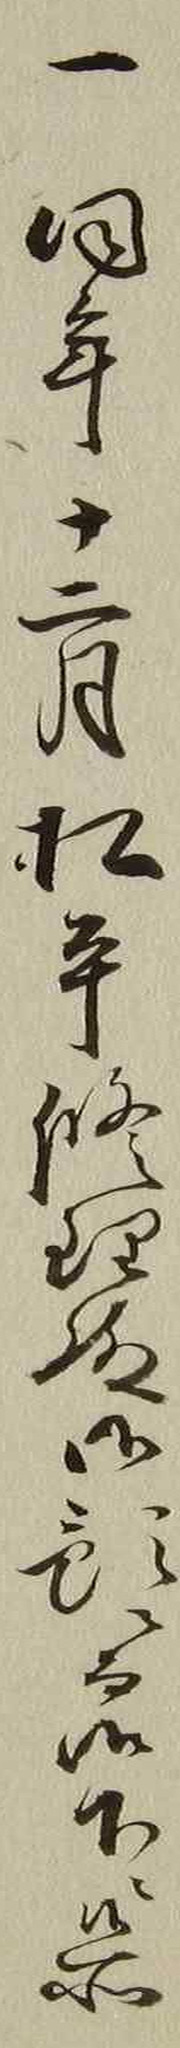一同年十二月松平修理殿御預ニ而候下ニ候所
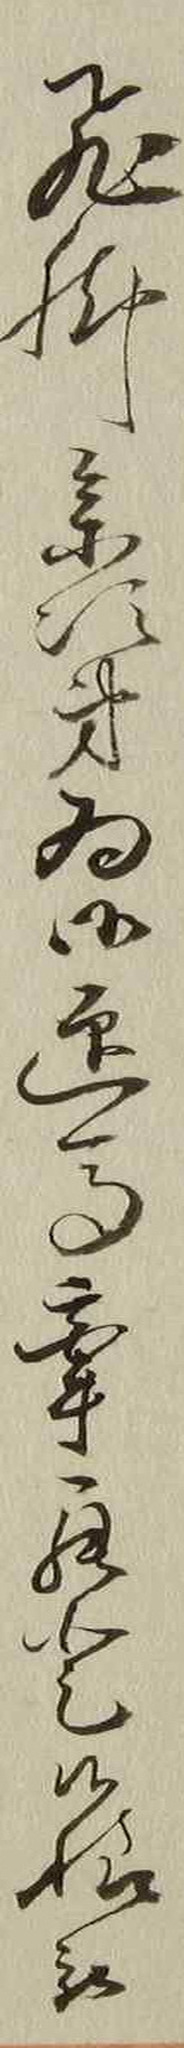飛脚参次第為御迎馬牽罷登候様被
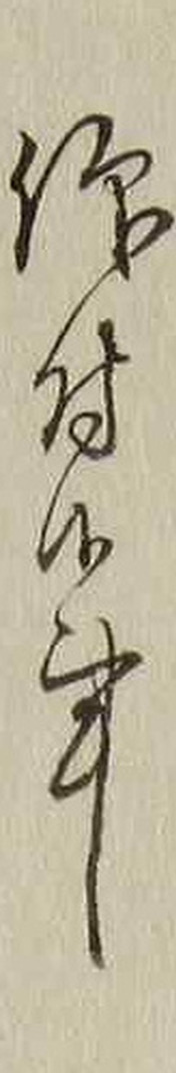仰付候事
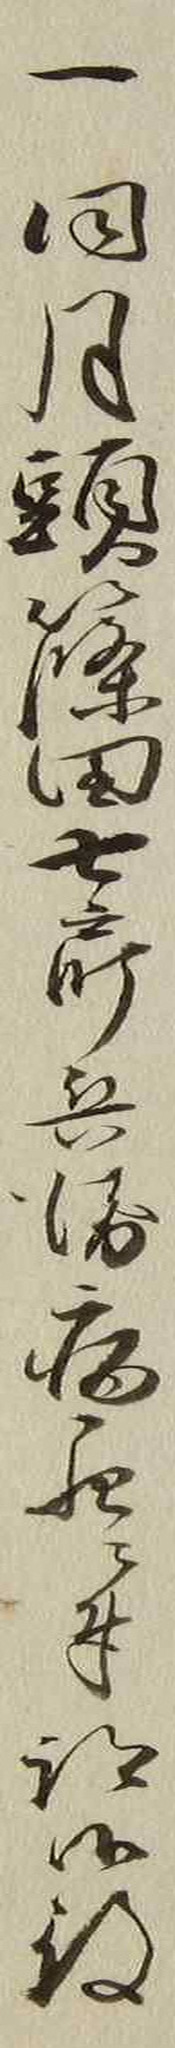一同月頭篠田七郎兵衛病死ニ付跡御役
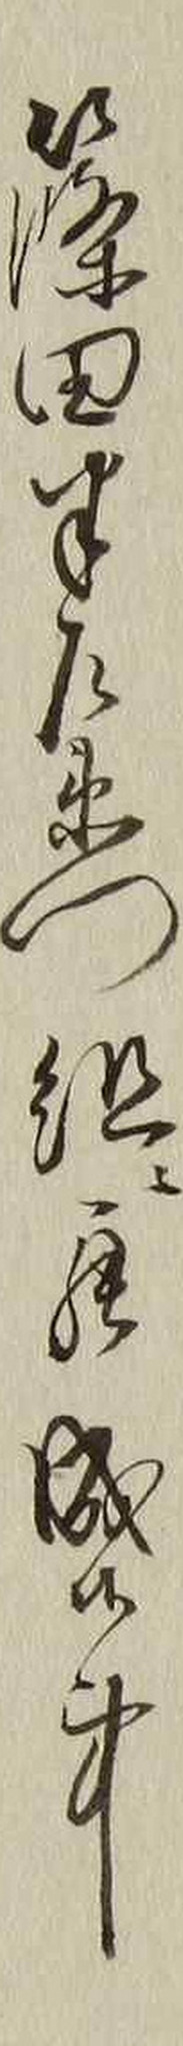篠田半左衛門組ニ罷成候事
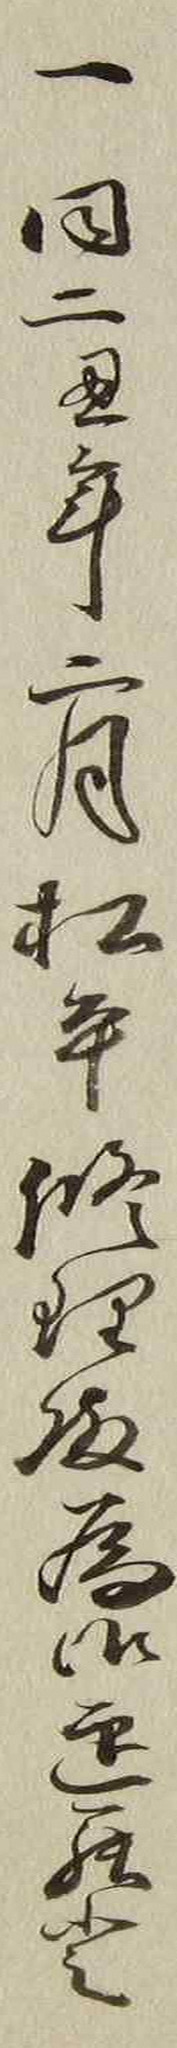一同二丑年二月松平修理殿為御迎罷登
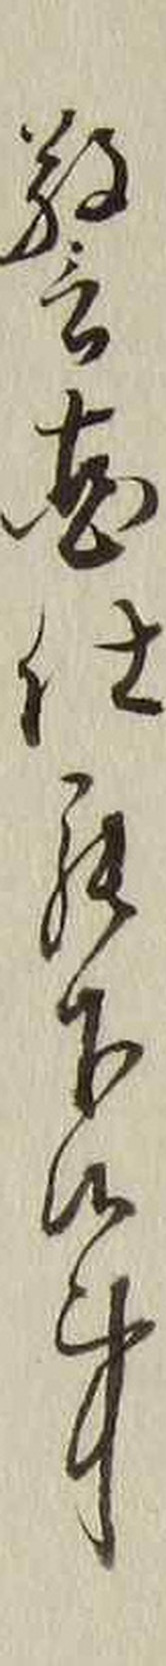警固仕罷下候事
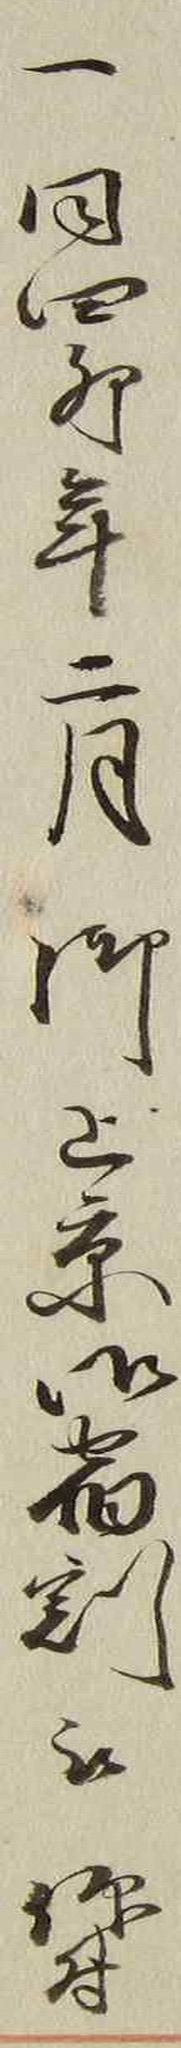一同四卯年二月御上京御宿割被仰付
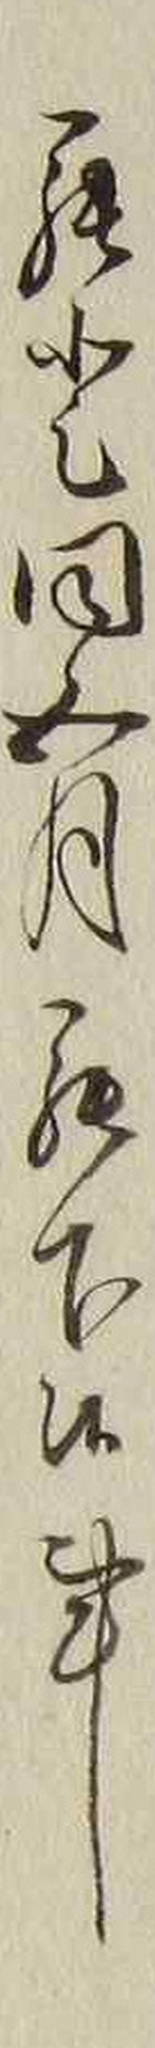罷登同五月罷下候事
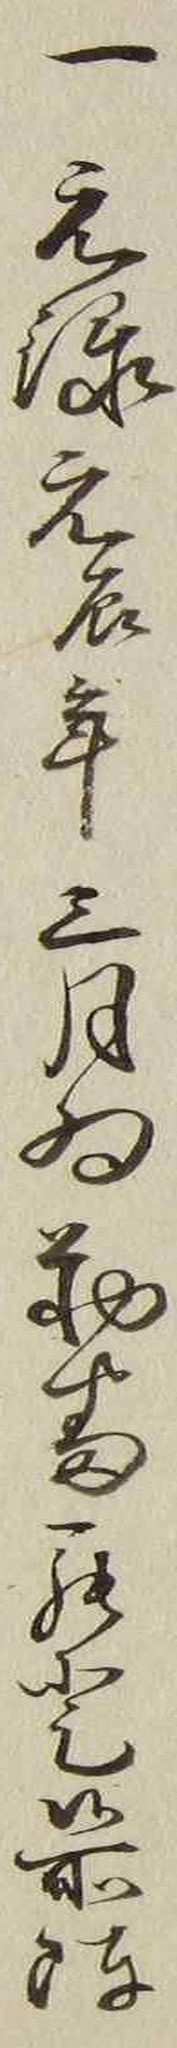一元録元辰年三月為勤番罷登候所陣
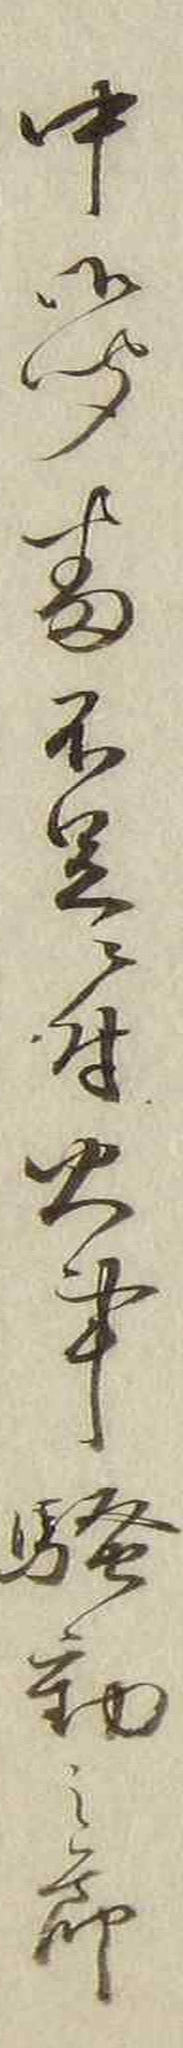中御聞番不足ニ付火事騒動之節

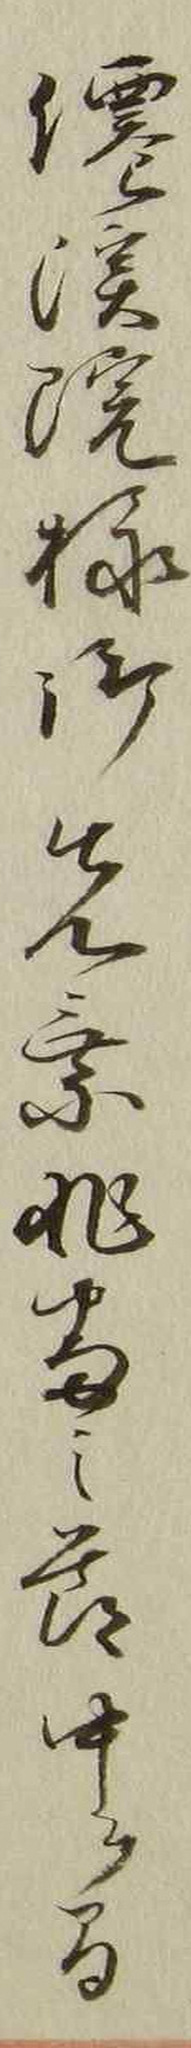仙渓院様御先乗非番之節中ヶ間
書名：諸士系譜　巻之122　よ之部5
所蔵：会津若松市立会津図書館
